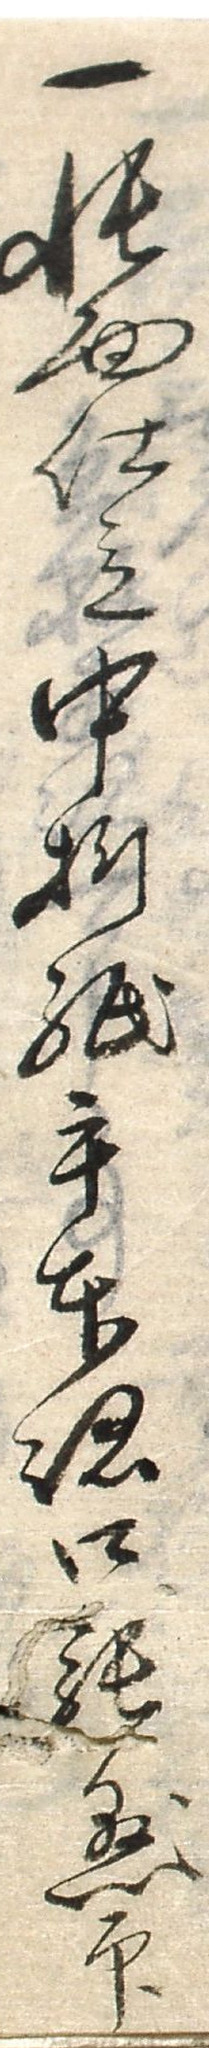一帳面仕立中折紙平本認口張懸印
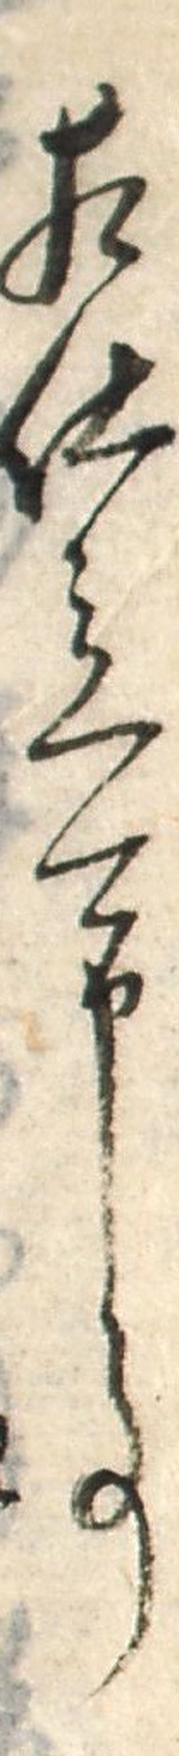相仕立可申事
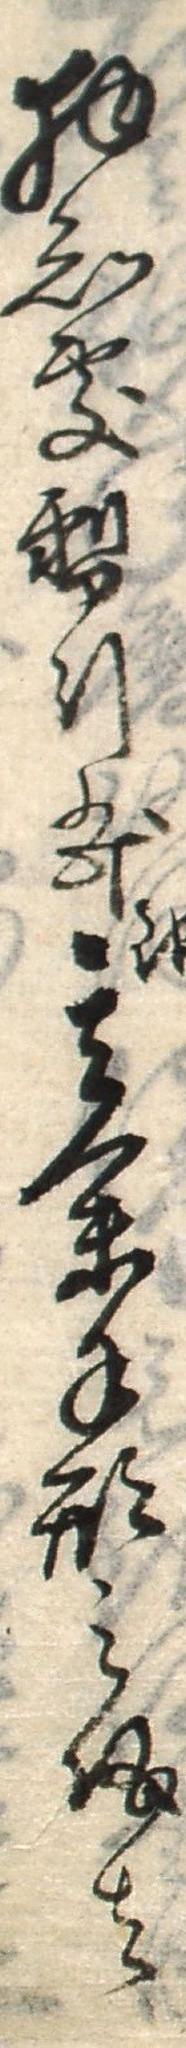拝知処務引当銀其余手形之儀は
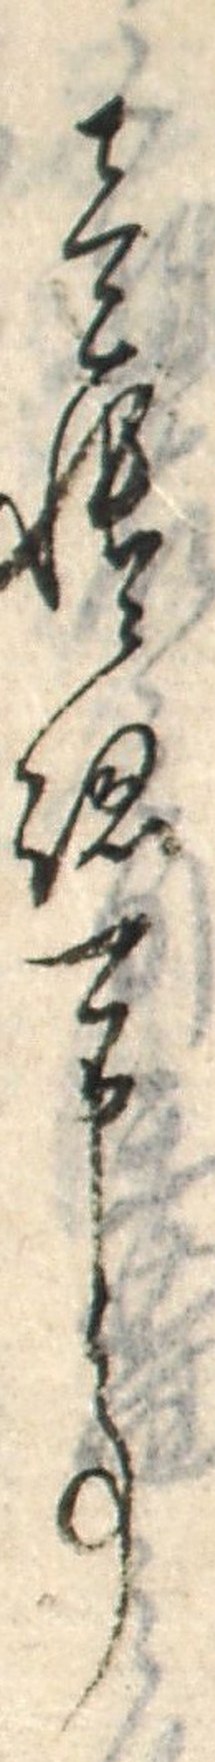壱帳に認可申事
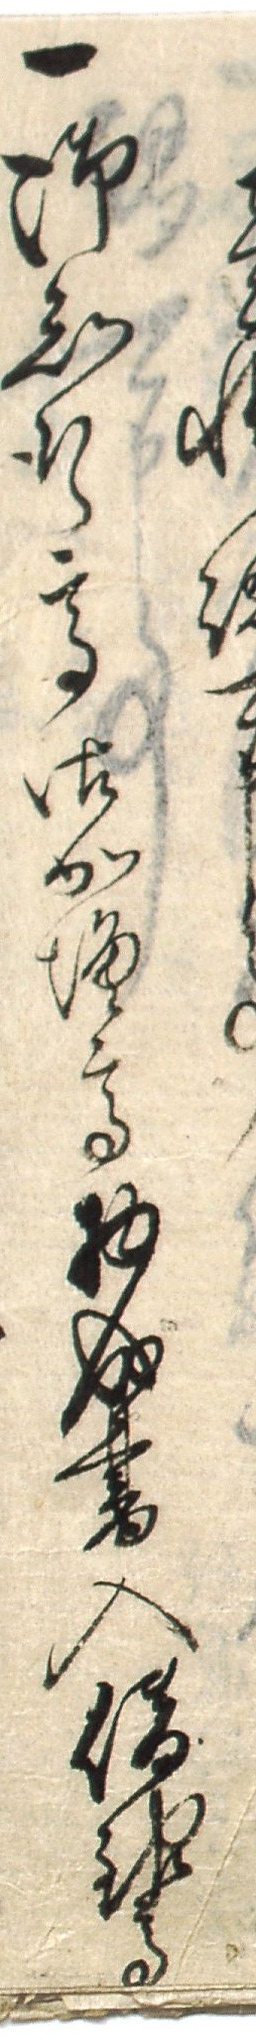一御知行高御加増高物成書入借銀高
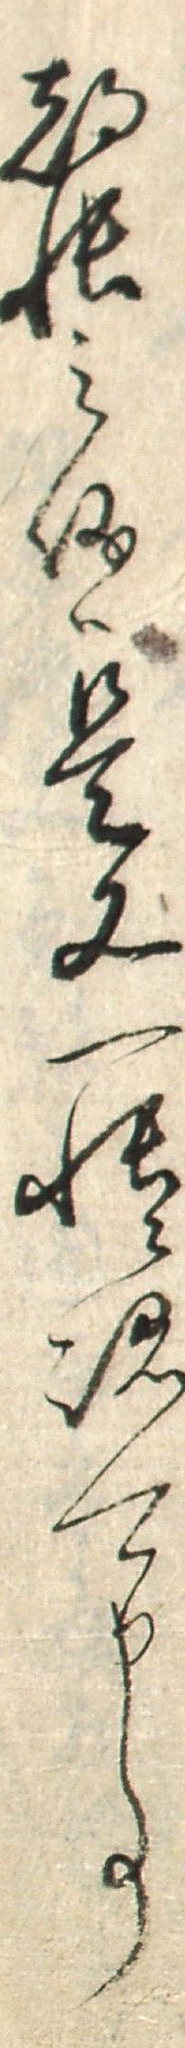都帳之儀は是又一帳に認可申事

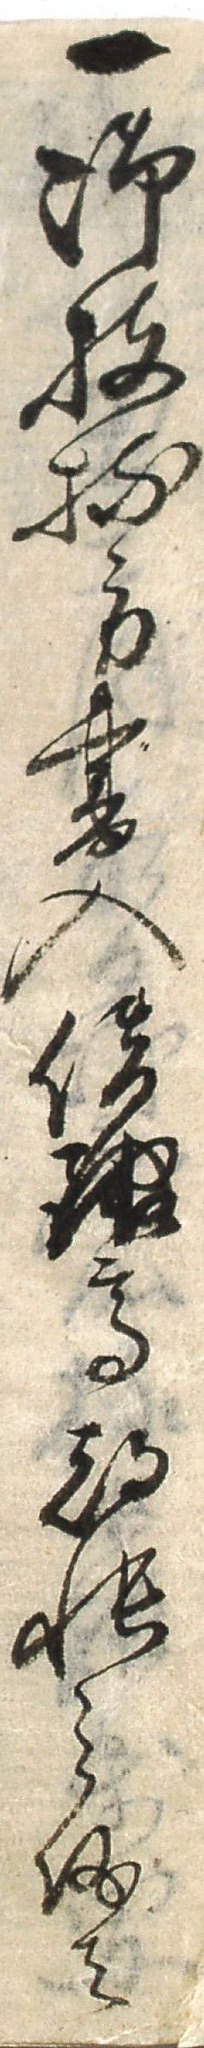一御扶持方書入借高都帳之儀は
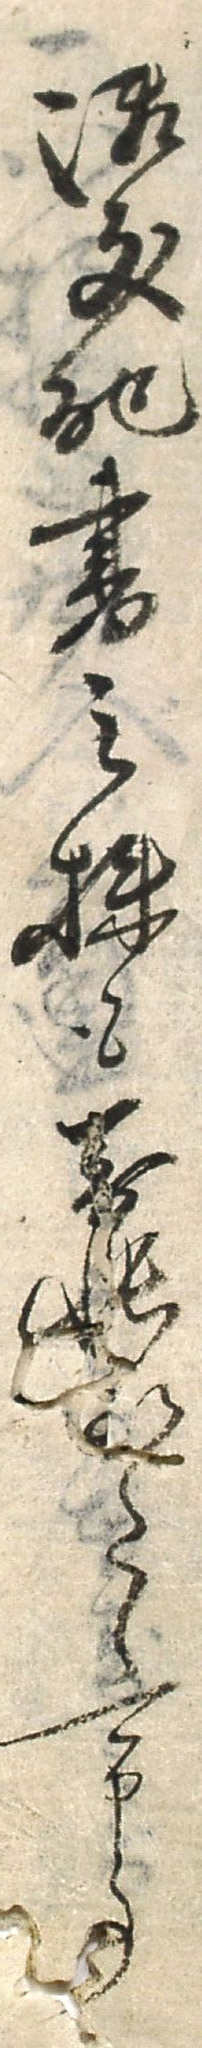御支配書之株も寄帳いたし可申事
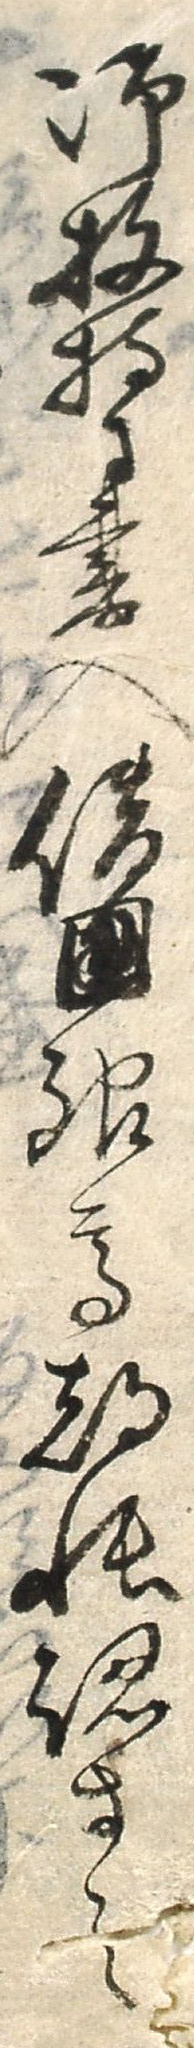御扶持方書入借銀高都帳認方之
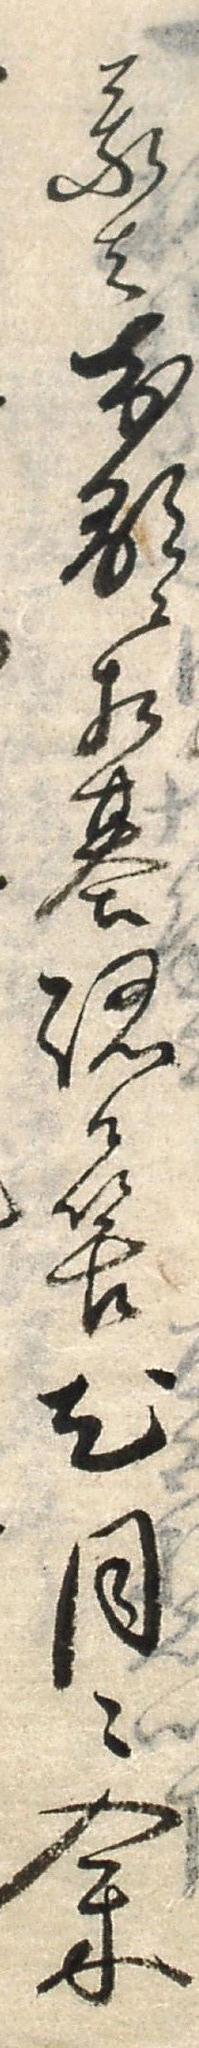義は前顕に相基認候筈尤月々入米
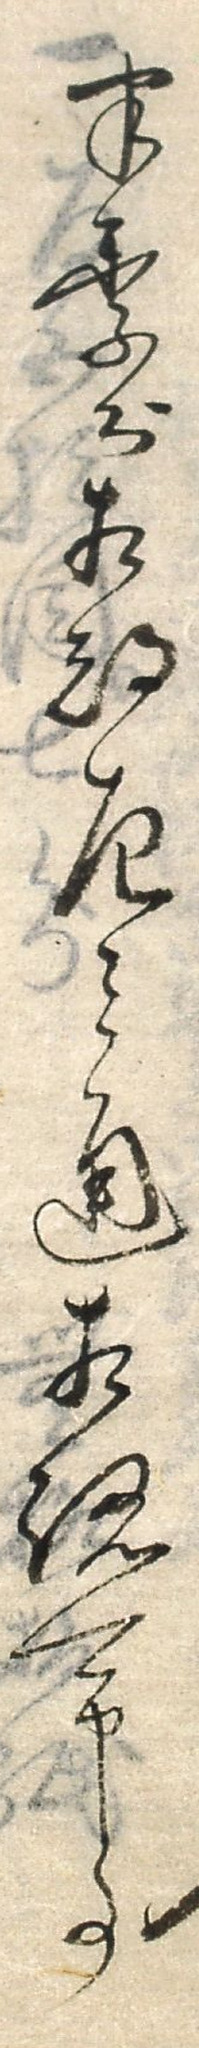半季分相都左之通相認可申事
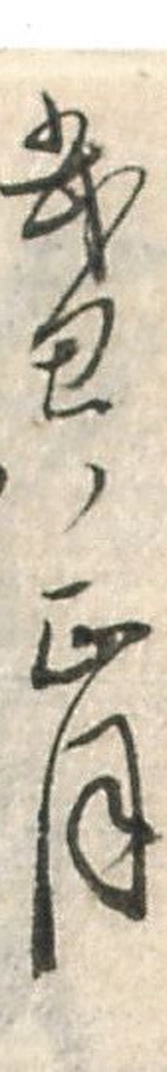当丑ノ正月
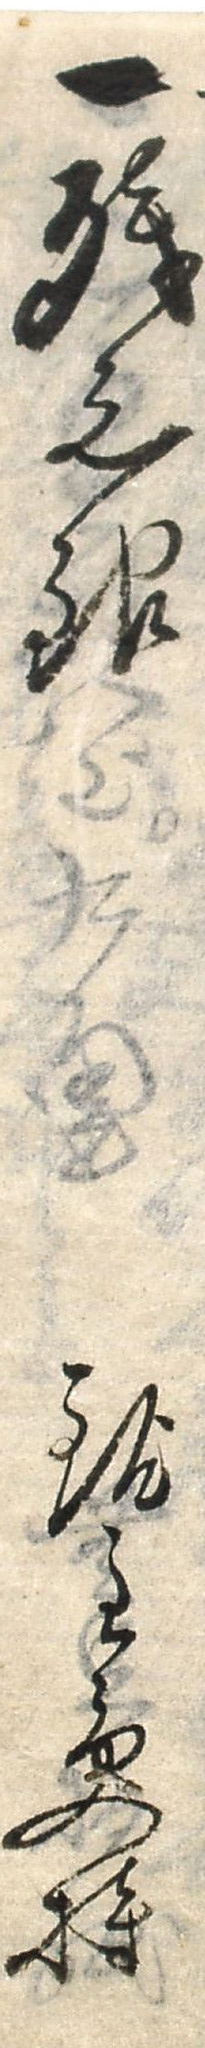一残元銀銀主受持
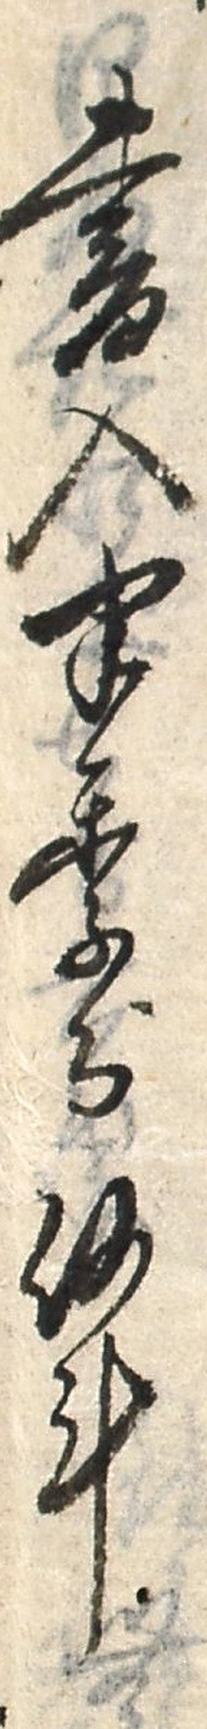書入半季分何斗
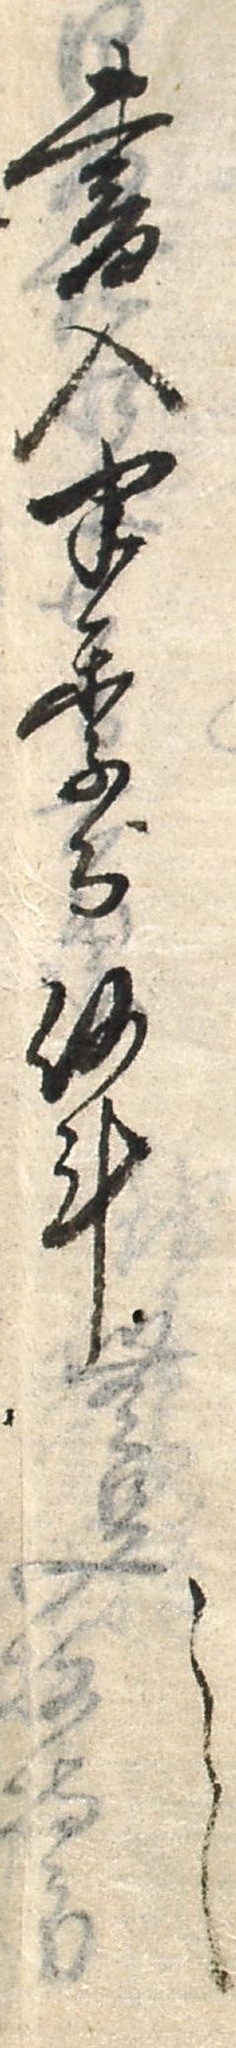書入半季分何斗
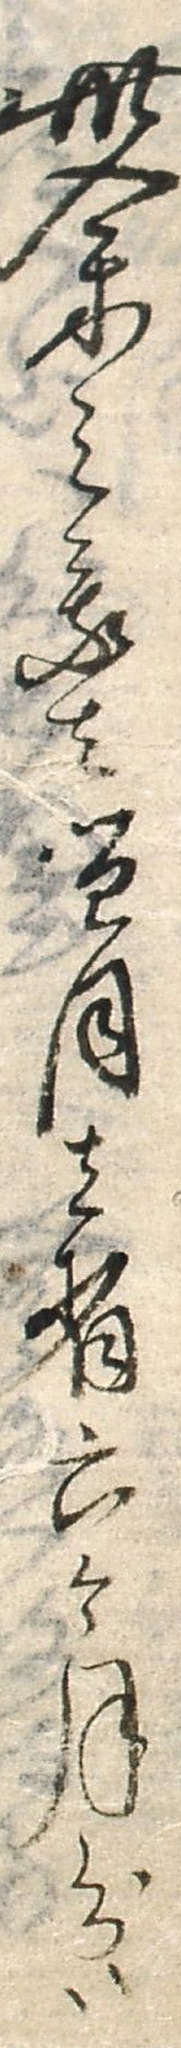此入米之義は閏月は省六ヶ月分は
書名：御家中并無格御奉公人借銀御仕解一件御書付写其余共控
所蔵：鳴門教育大学 Naruto University of Education
